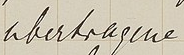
übertragene
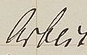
Arbeit
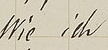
wie ich
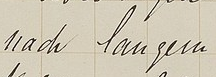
nach langem
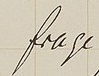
Frage
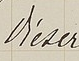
erst
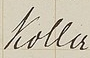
Herrn
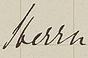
Koller
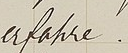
erfahre.
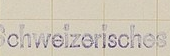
Dieser sagt mir die
